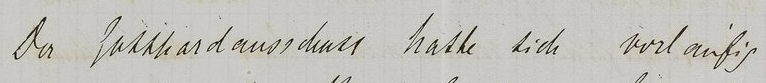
Der Gotthardausschuss hatte sich vorläufig
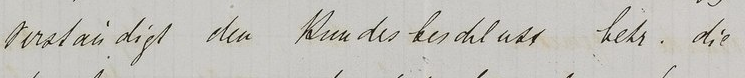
verständigt den Bundesbeschluss betr. die
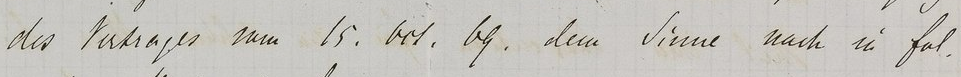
des Vertrages vom 15. Oct. 69. dem Sinne nach in fol-
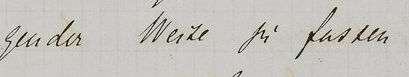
gender Weise zu fassen:
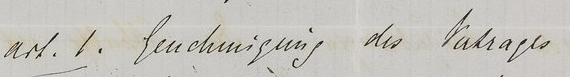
Art. 1. Genehmigung des Vertrages
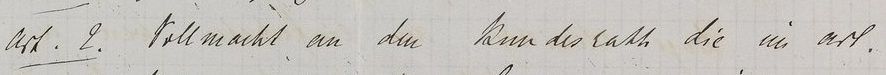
Art. 2. Vollmacht an den Bundesrath die im Art.
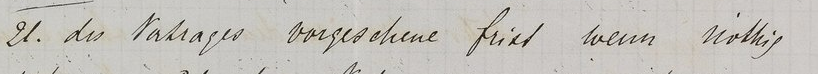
21. des Vertrages vorgesehene Frist wenn nöthig
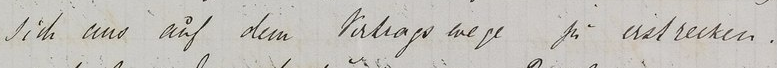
sich aus auf dem Vertragswege zu erstrecken.
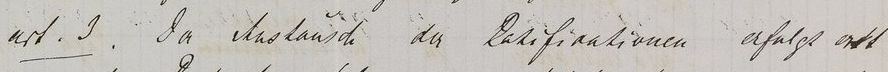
Art. 3. Der Austausch der Ratificationen erfolgt erst
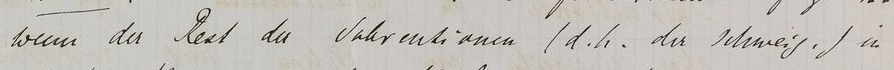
wenn der Rest der Subventionen (d. h. der schweiz.) in
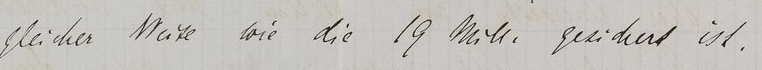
gleicher Weise wie die 19 Mill. gesichert ist.
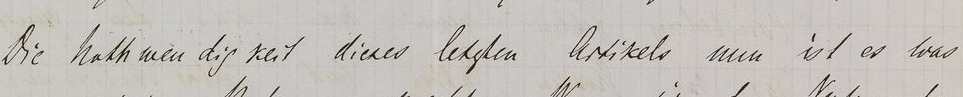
Die Nothwendigkeit dieses letzten Artikels nun ist es was
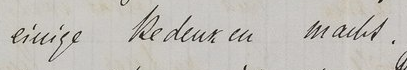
einige Bedenken macht.
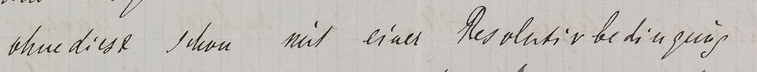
ohnediess schon mit einer Resolutivbedingung
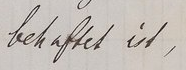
behaftet ist,
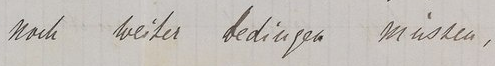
noch weiter bedingen müssen,
